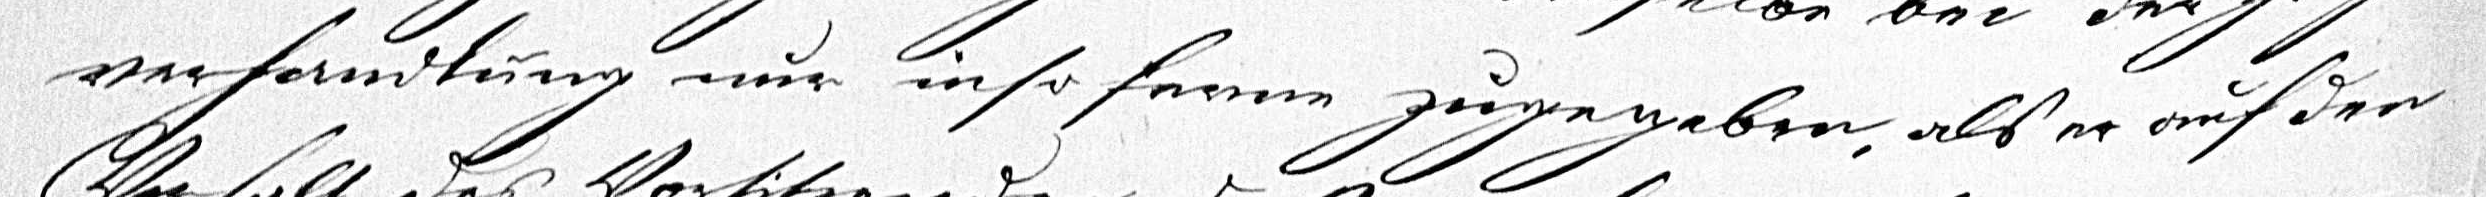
verhandlung nur insoferne zugegeben, als er auf den
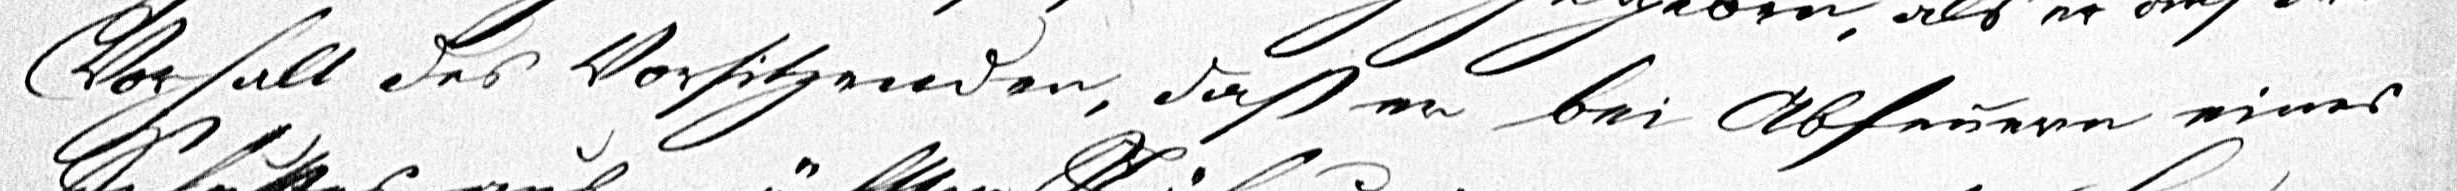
Vorhalt des Vorsitzenden, daß er bei Abfeuere eines
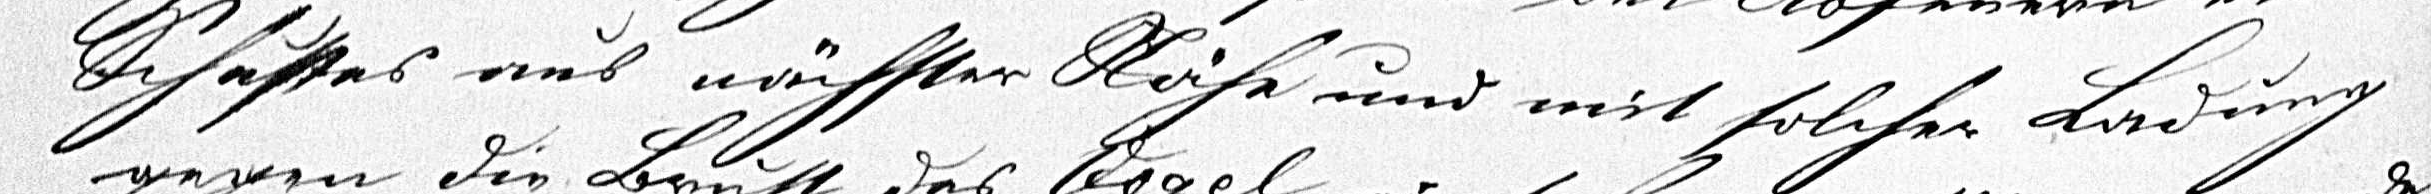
Schußes aus nächster Nähe und mit solcher Ladung
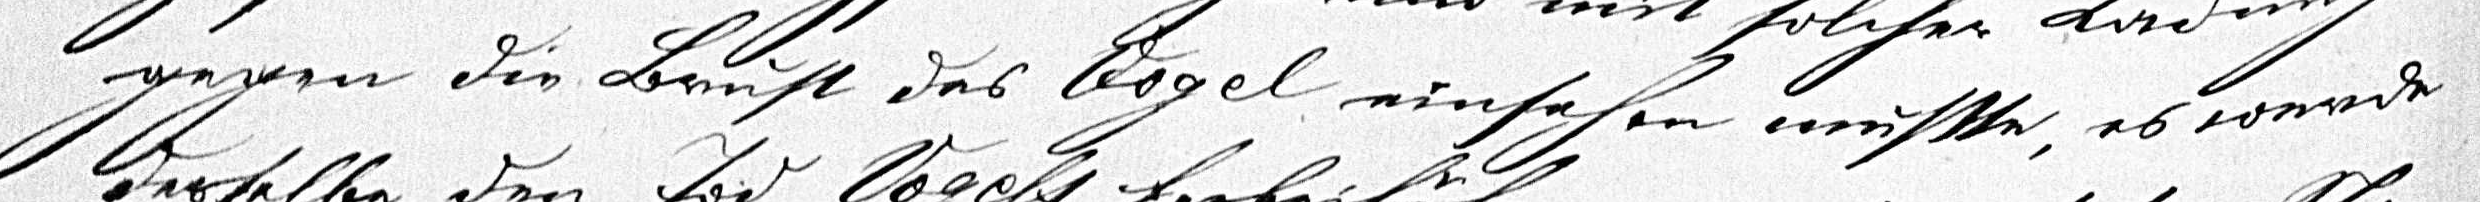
gegen die Brust des Vogel einsehen mußte, es werde
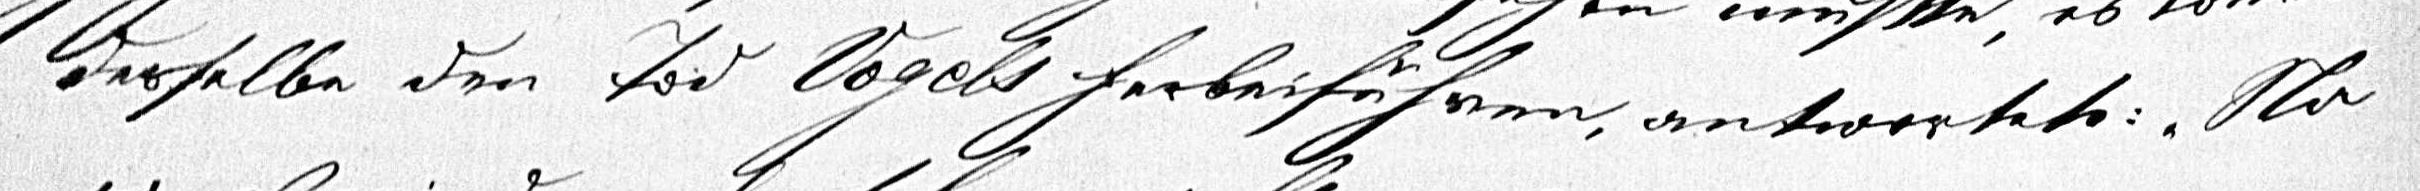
derselbe den Tod Vogels herbeiführen, antwortete: „Na
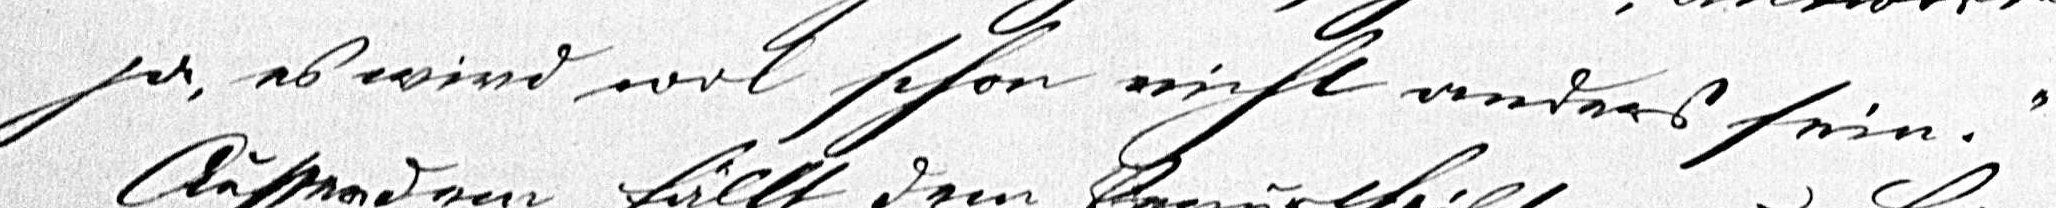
ja, es wird xx schon nicht anders sein."
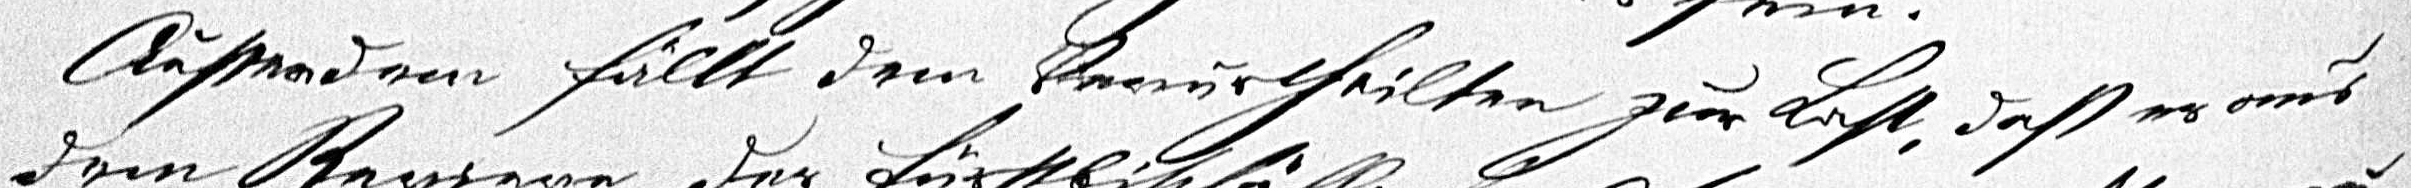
Außerdem fällt dem Verurtheilten zur Last, daß er aus
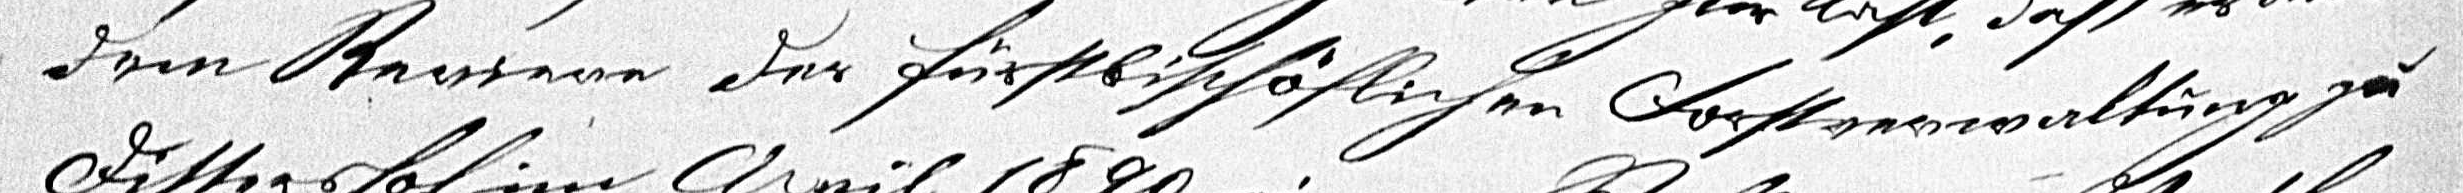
dem Reviere der fürstbischöflichen Forstverwaltung zu
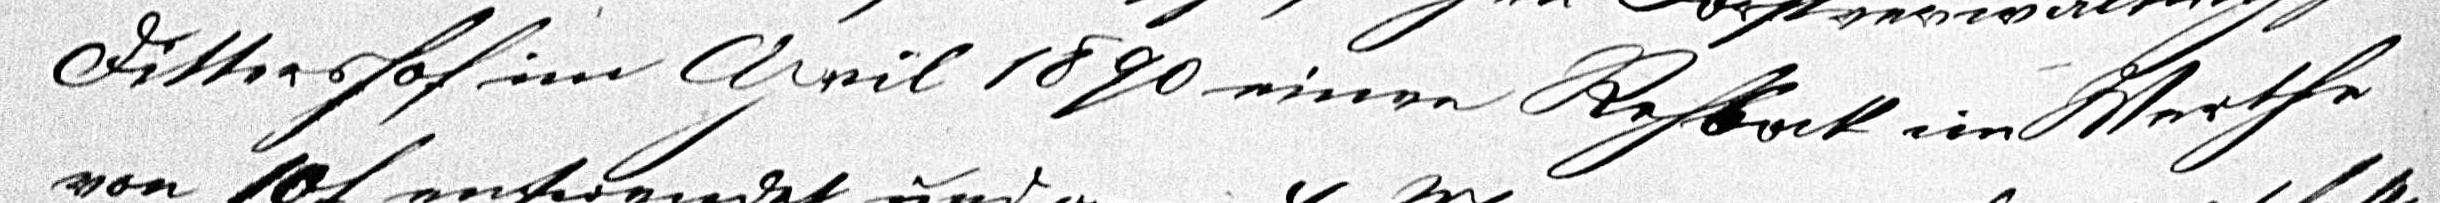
Dittershof im April 1890 einen Rehbock im Werthe
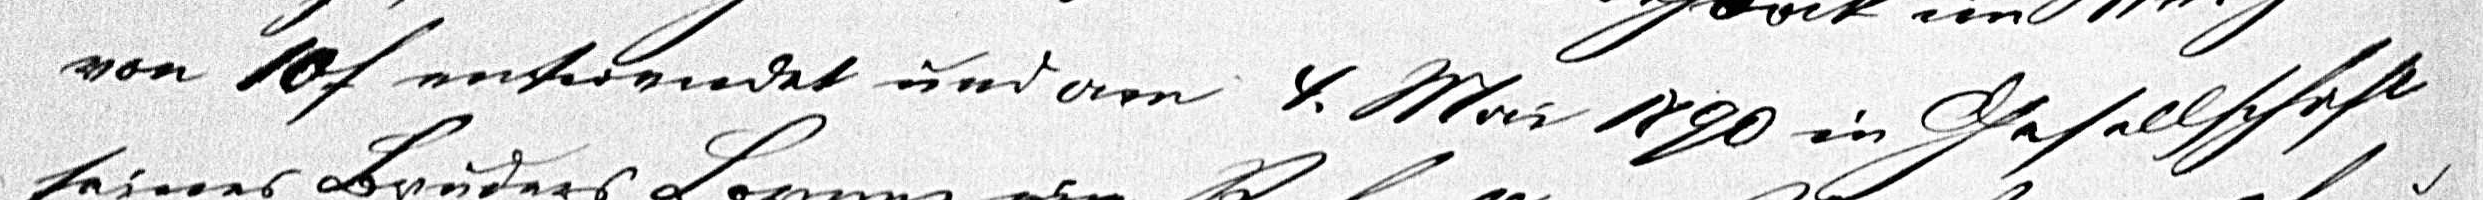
von 10f entwendet und am 4. Mai 1790 in Gesellschaft
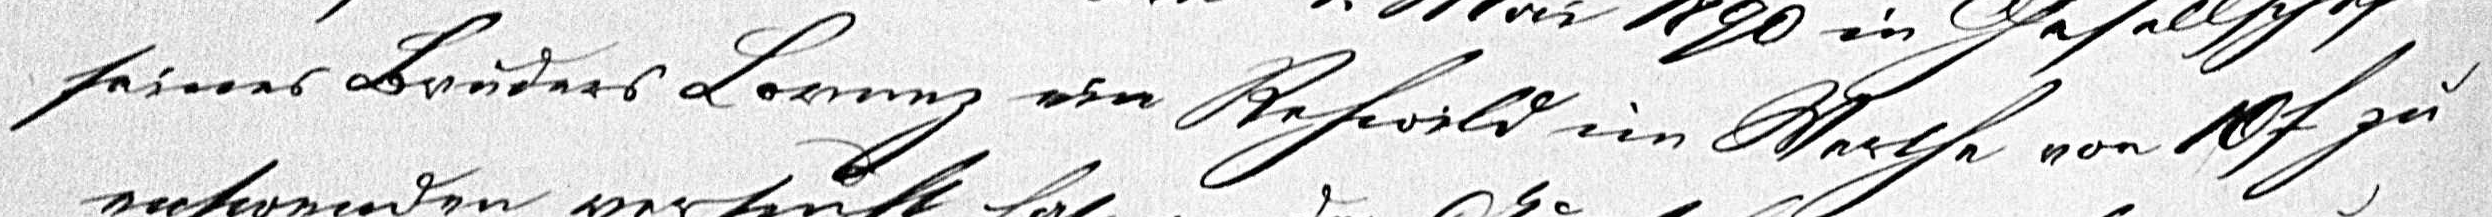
seines Bruders Lorenz ein Rehwild im Werthe von 10f zu
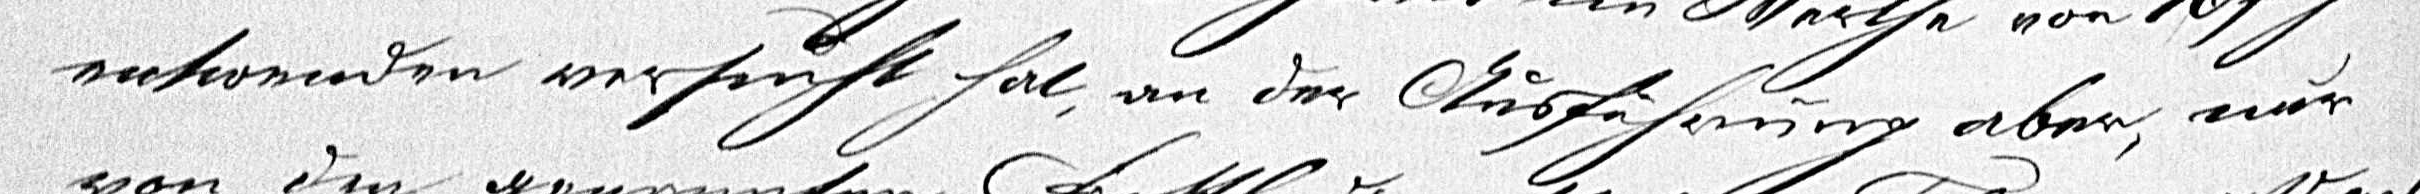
entwenden versucht hat, an der Ausführung aber, nur
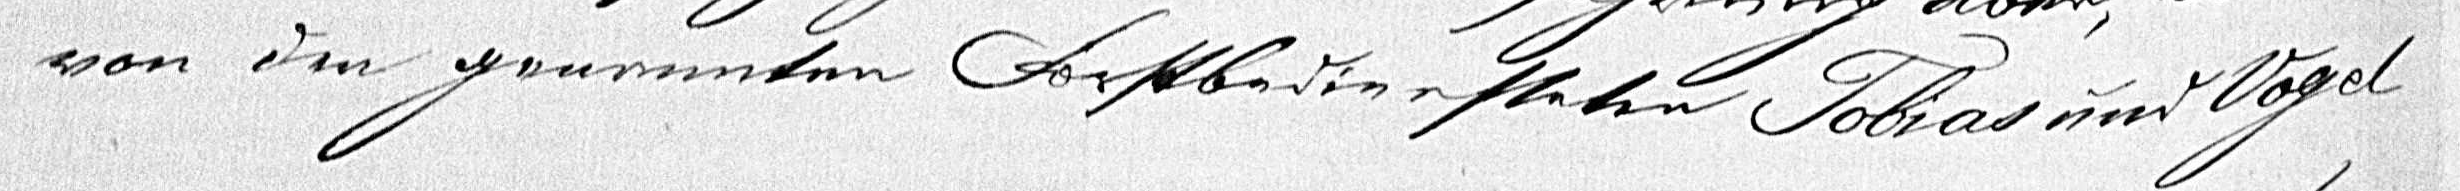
von den genannten Forstbediensteten Tobias und Vogel
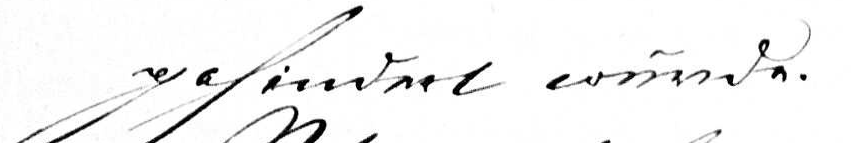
gehindert wurde.
